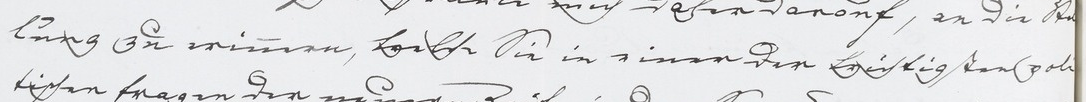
lung zu erinnern, welche Sie in einer der wichtigsten poli-
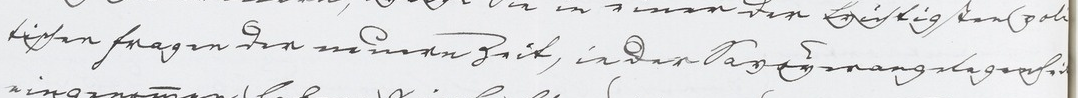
tischen Fragen der neuern Zeit, in der Savoyerangelegenheit,
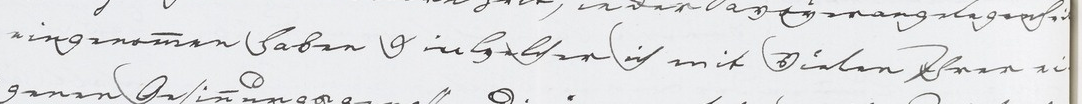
eingenommen haben & in welcher ich mit vielen Ihrer ei-
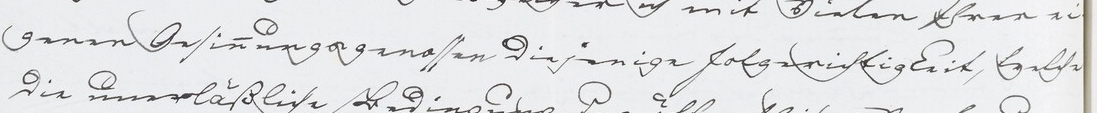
genen Gesinnungsgenossen diejenige Folgerichtigkeit, welche
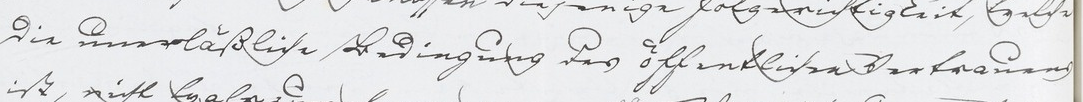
die unerläßliche Bedingung des öffentlichen Vertrauens
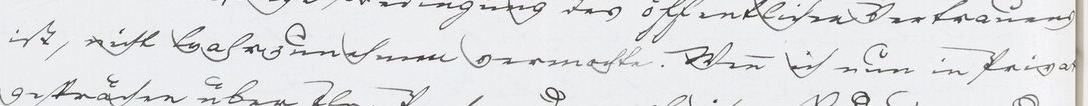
ist, nicht wahrzunehmen vermochte. Wenn ich nun in Privat-
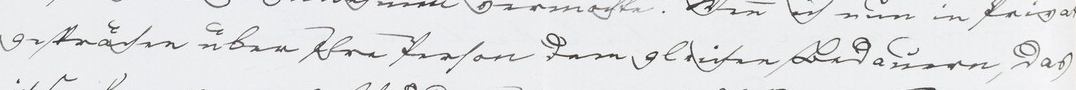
gesprächen über Ihre Person dem gleichen Bedauern, das
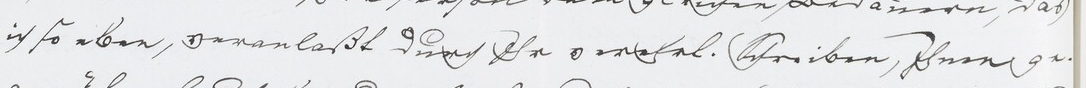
ich soeben, veranlaßt durch Ihr verehrl. Schreiben, Ihnen ge-
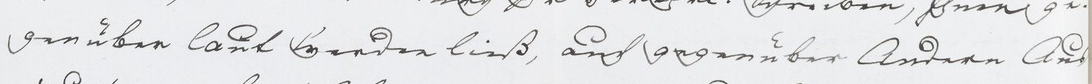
genüber laut werden ließ, auch gegenüber Andern Aus-
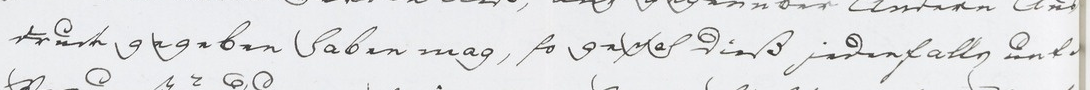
druck gegeben haben mag, so geschah dieß jedenfalls unter
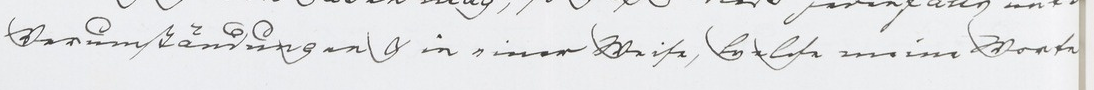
Verumständungen & in einer Weise, welche meine Werte
